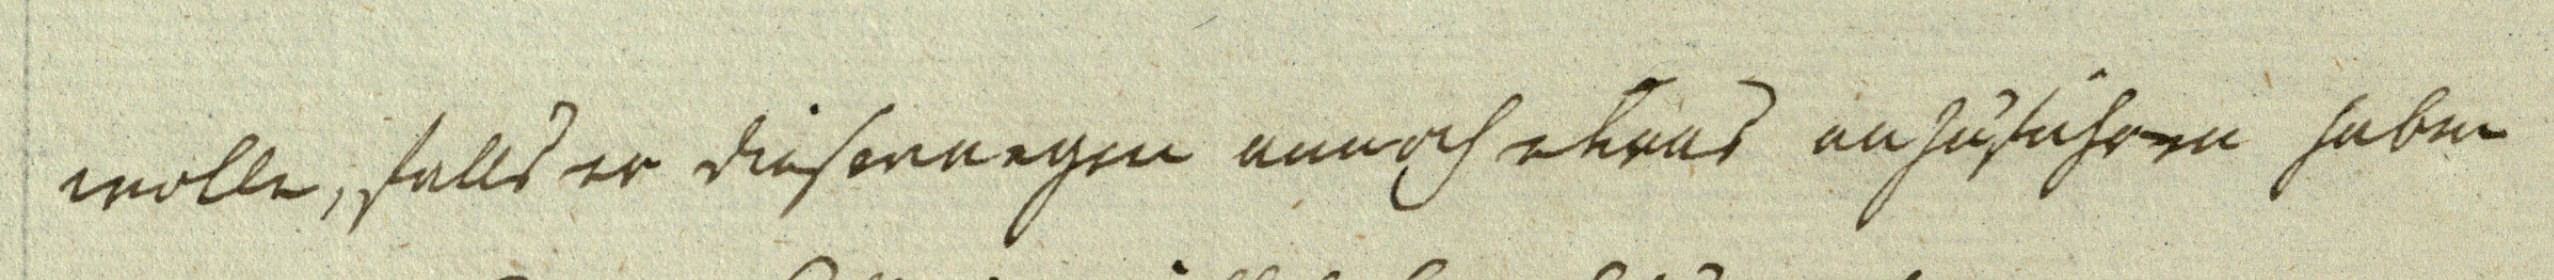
wolle, falls er dieserwegen annoch etwas anzuführen haben
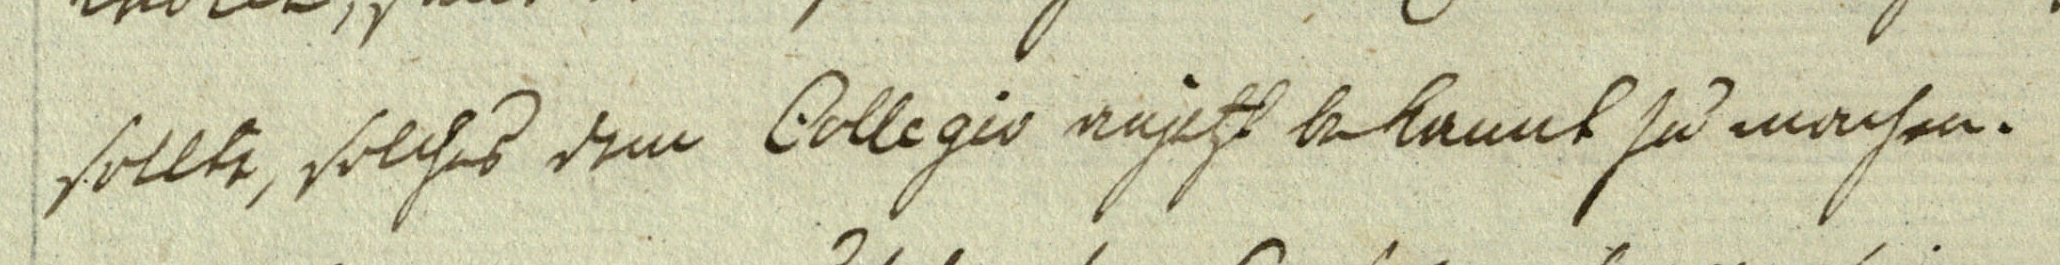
sollte, solches dem Collegio anjetzt bekannt zu machen.
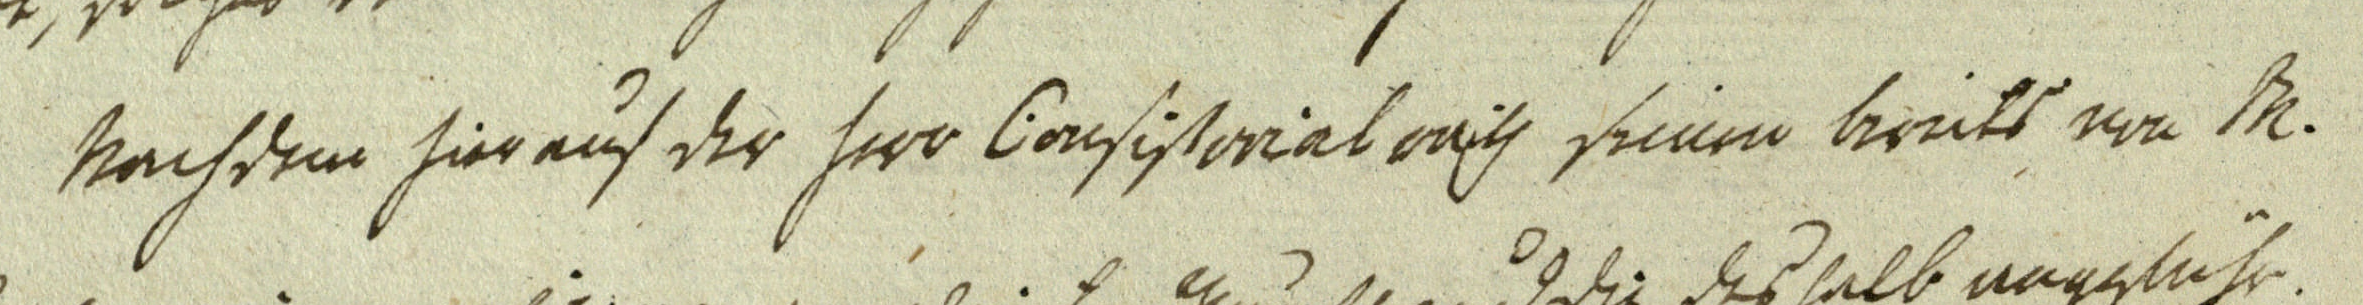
Nachdem hierauf der Herr Consistorialrath seinen bereits von M.
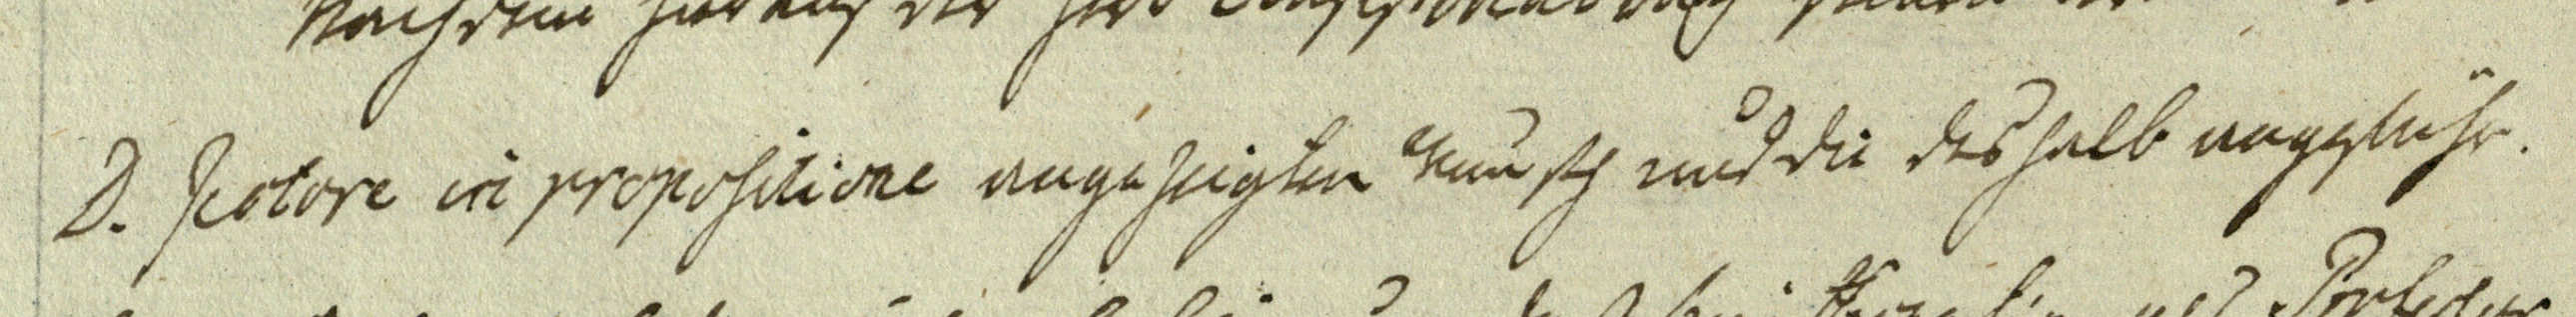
D. Rectore in propositione angezeigten Wunsch und die deshalb angeführ¬
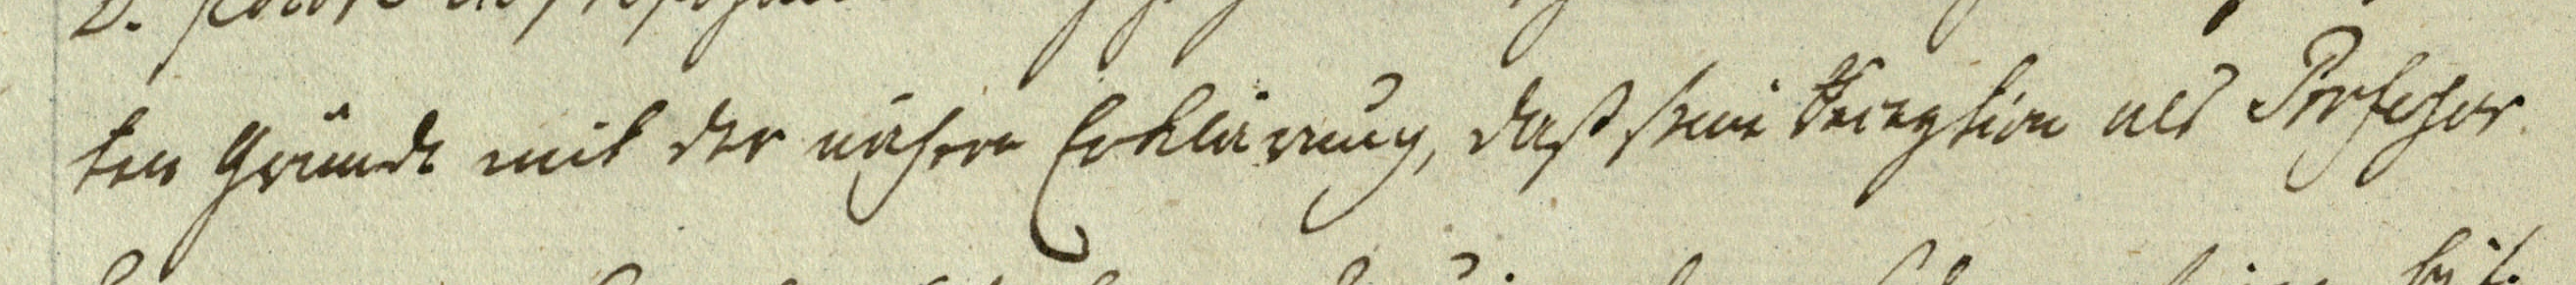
ten Gründe mit der nähern Erklärung, daß seine Reception als Professor
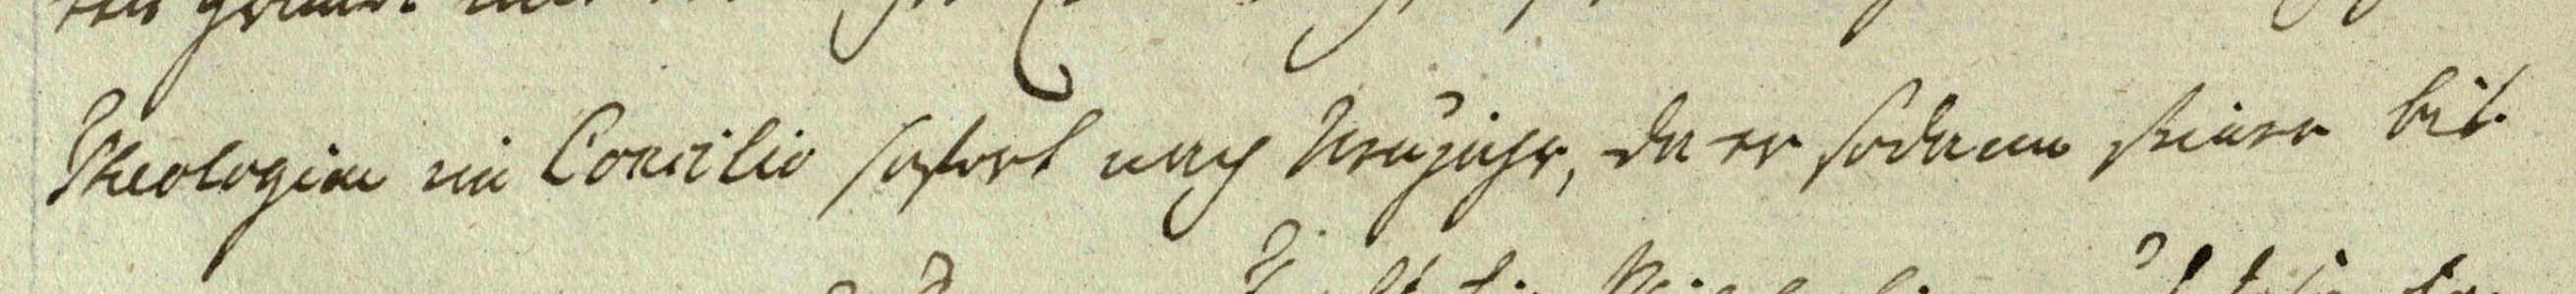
Theologiae im Concilio sofort nach Neujahr, der sodann seiner bis¬
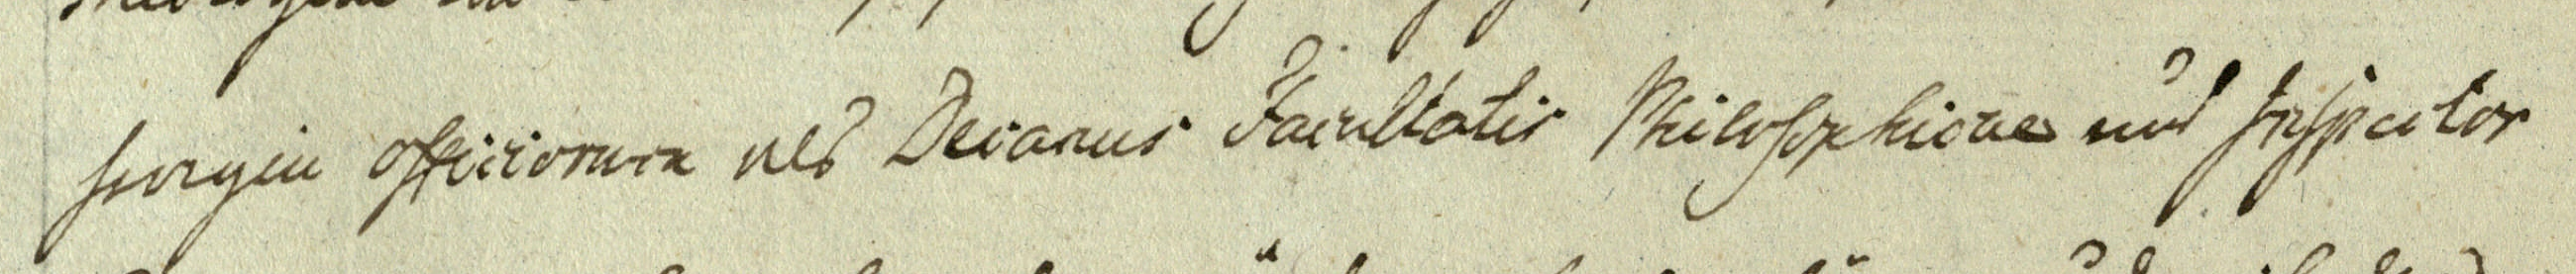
herigen officiorum als Decanus Facultatis Philosophicae und Inspector
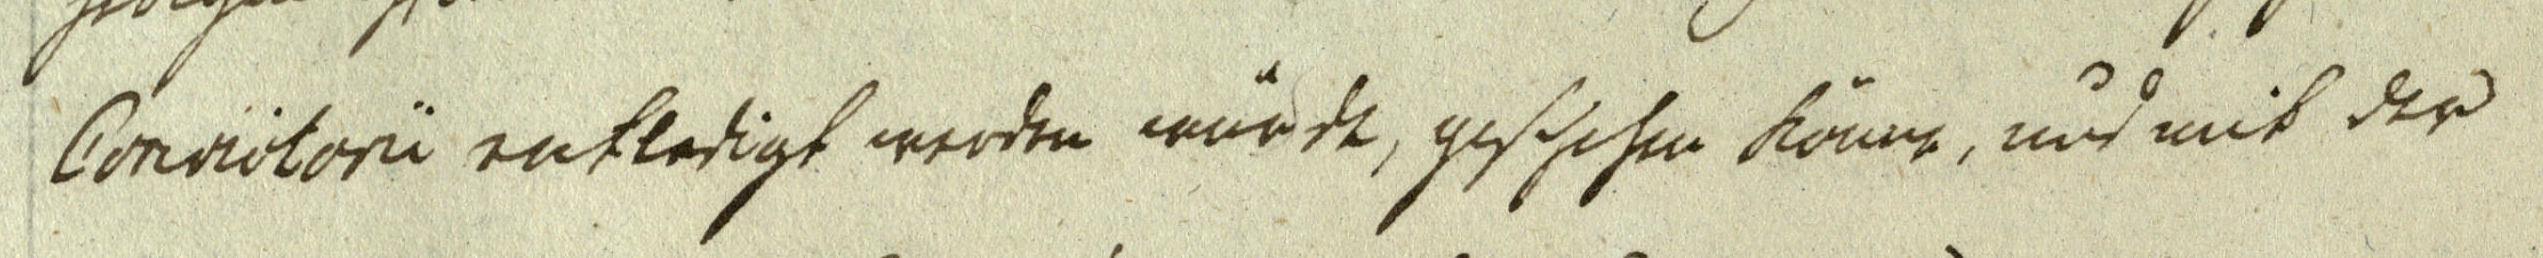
Convictorii entlediget werden würde, geschehen könne, und mit der
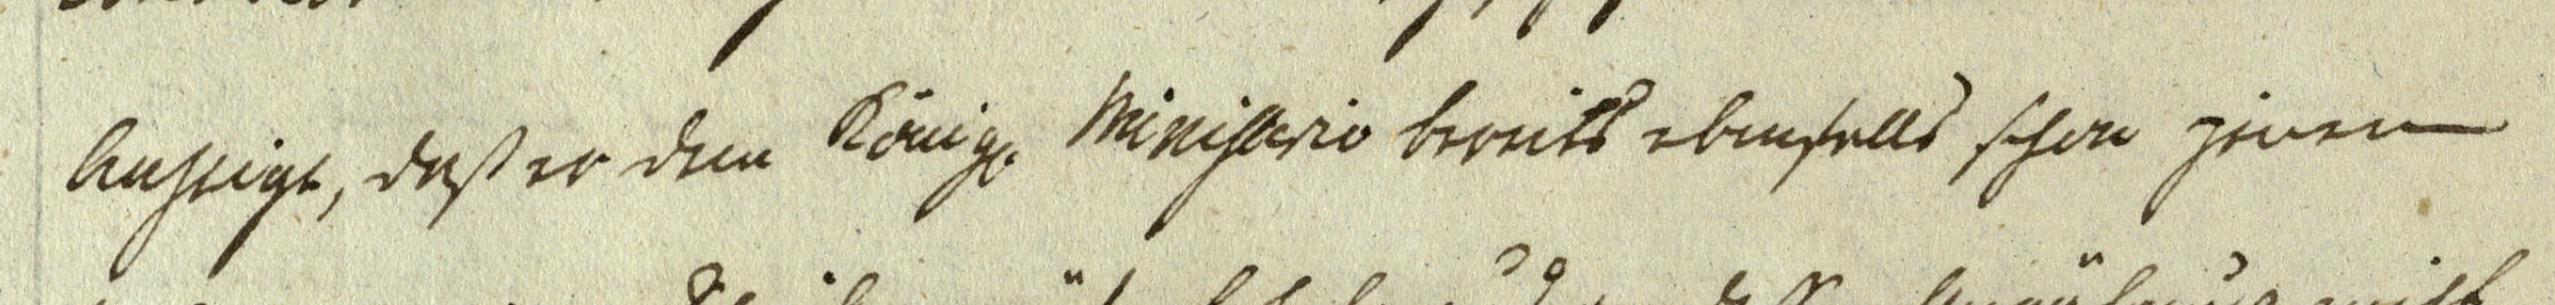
Anzeige, daß er dem Königl. Ministerio bereits ebenfalls schon jenen
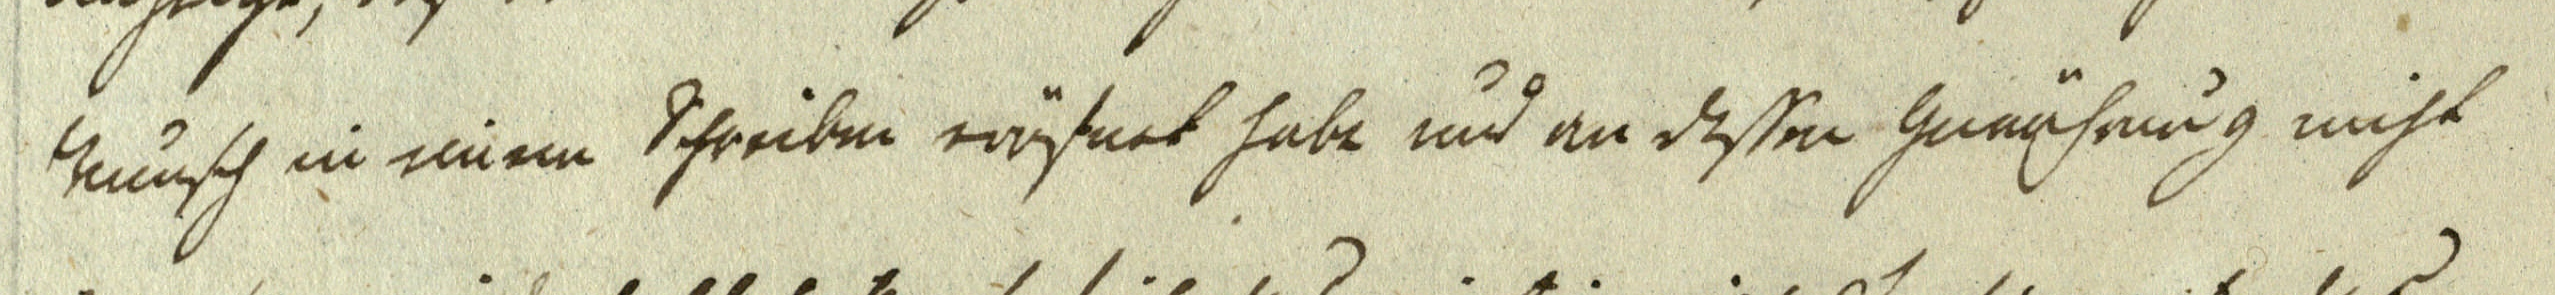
Wunsch in einem Schreiben eröfnet habe und an dessen Gewährung nicht
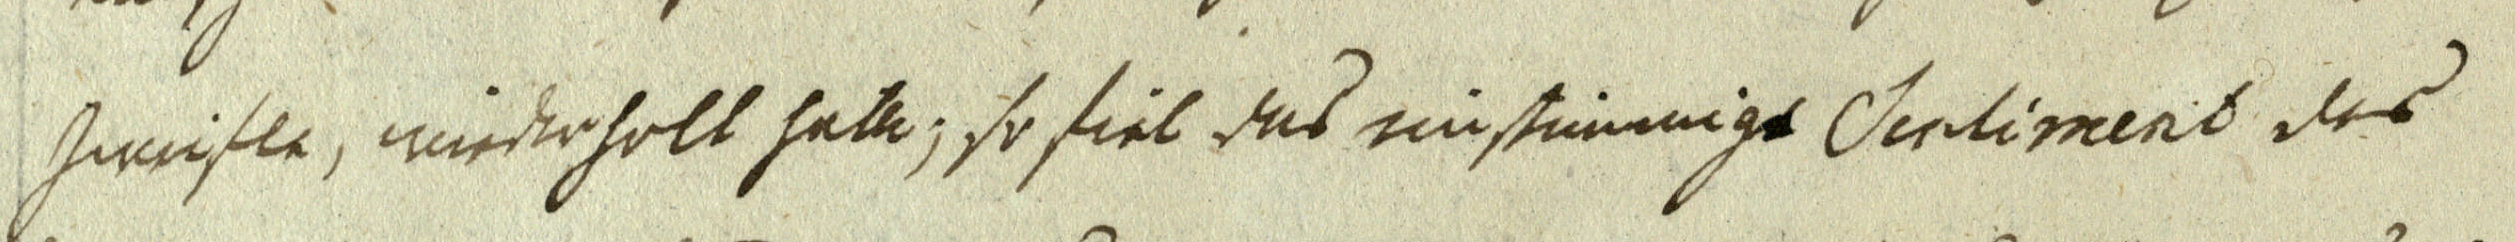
zweifle, wiederholt hatte; so fiel das einstimmige Sentiment des
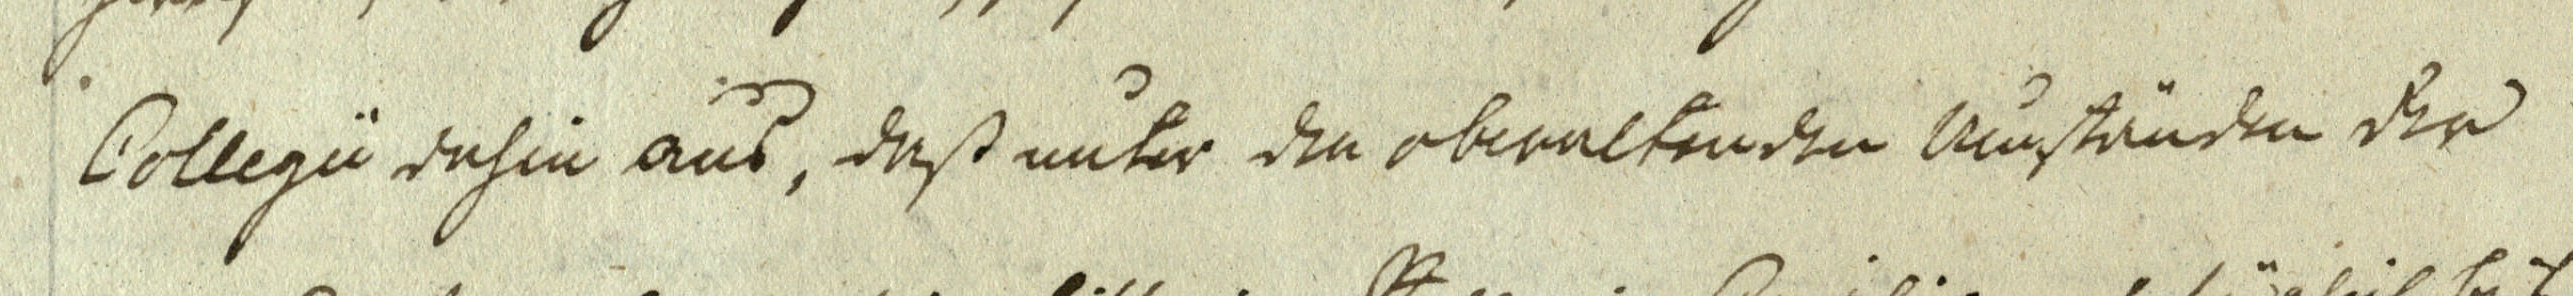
Collegii dahin aus, daß unter den obwaltenden Umständen der
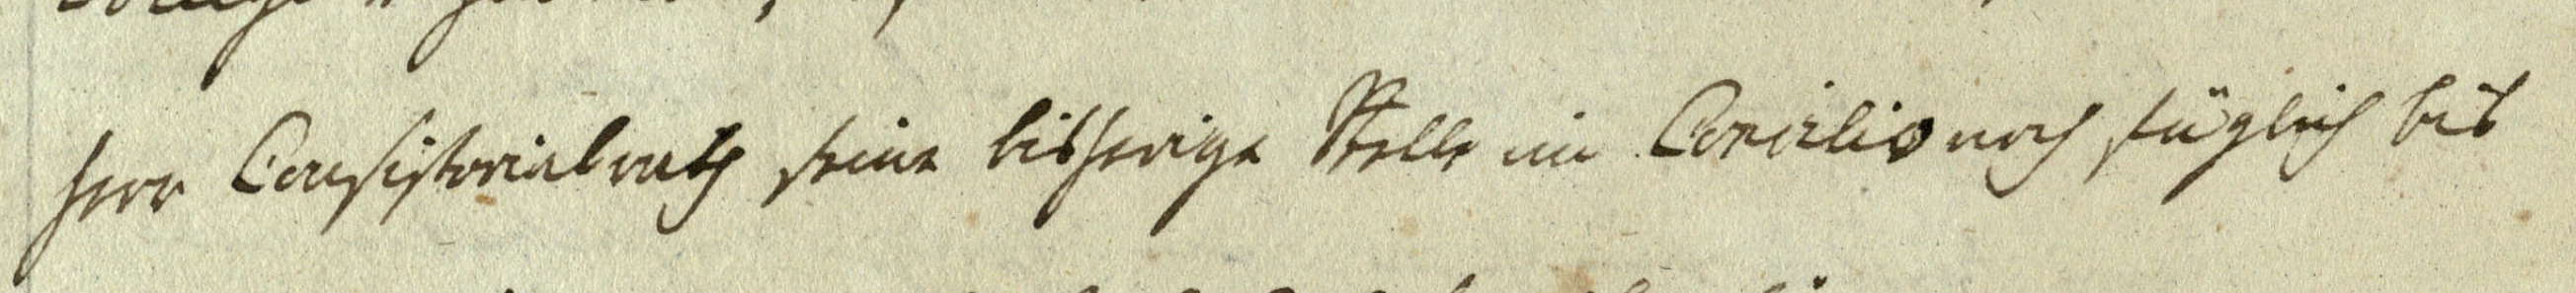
Herr Consistorialrath seine bisherige Stelle in Concilio noch füglich bis
